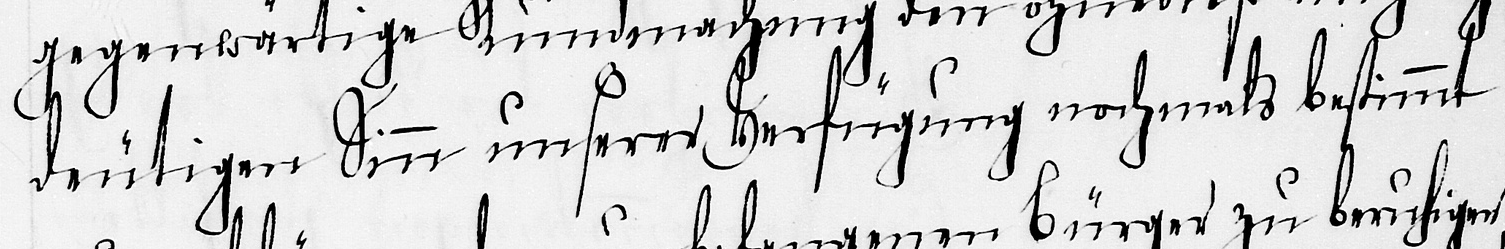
deutigen Sinn unserer Verfügung nochmals bestimmt
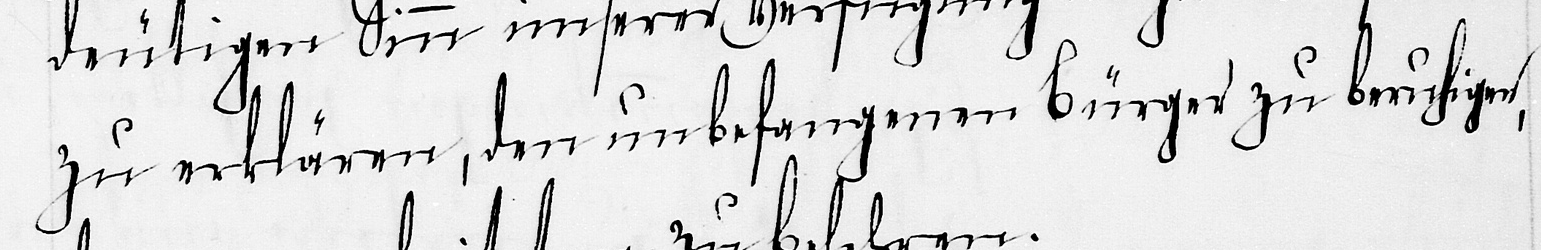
zu erklären, den unbefangenen Bürger zu beruhigen,
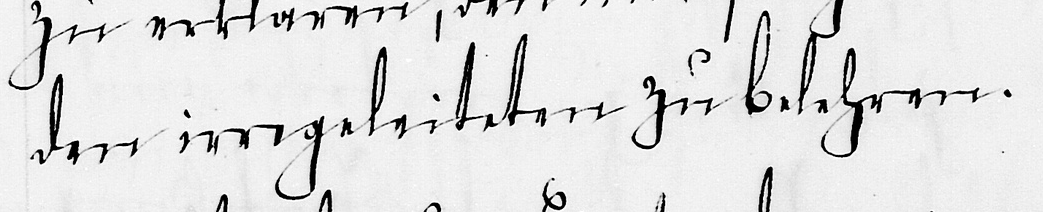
den irregeleiteten zu belehren.
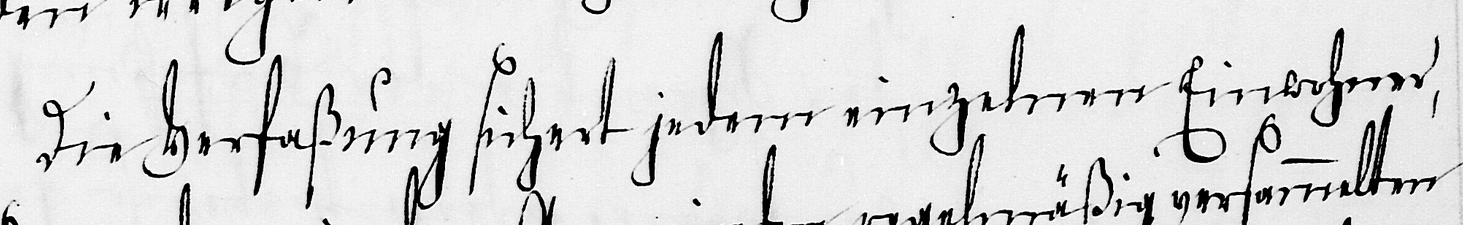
Die Verfaßung sichert jedem einzelnen Einwohner,
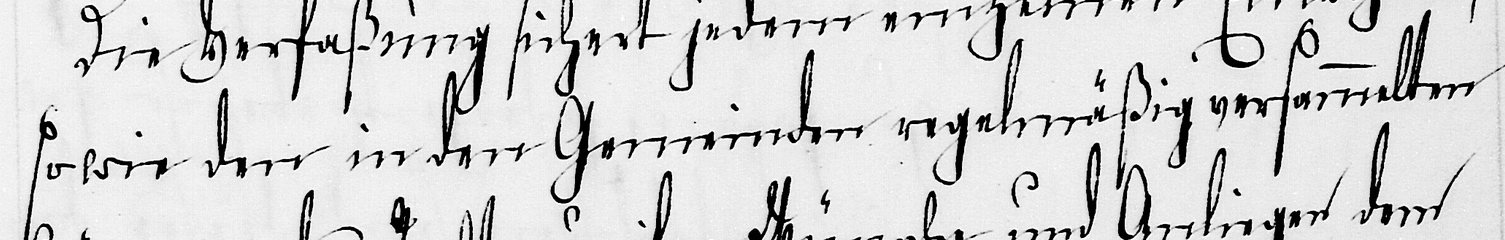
sowie den in den Gemeinden regelmäßig versammelten
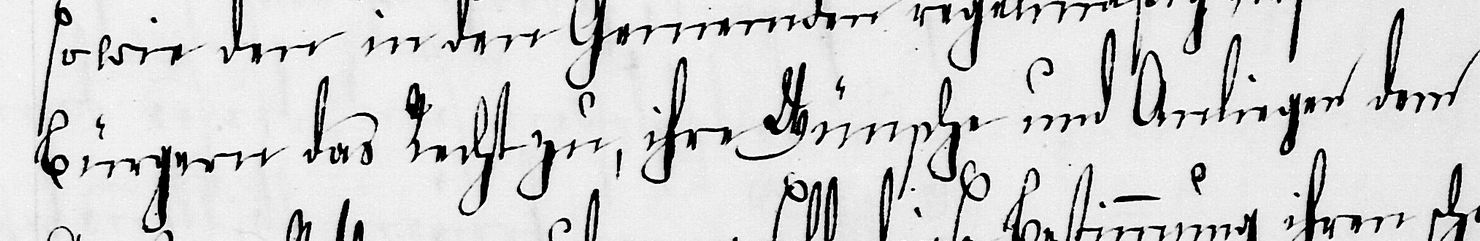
Bürgern das Recht zu, ihre Wünsche und Anliegen dem
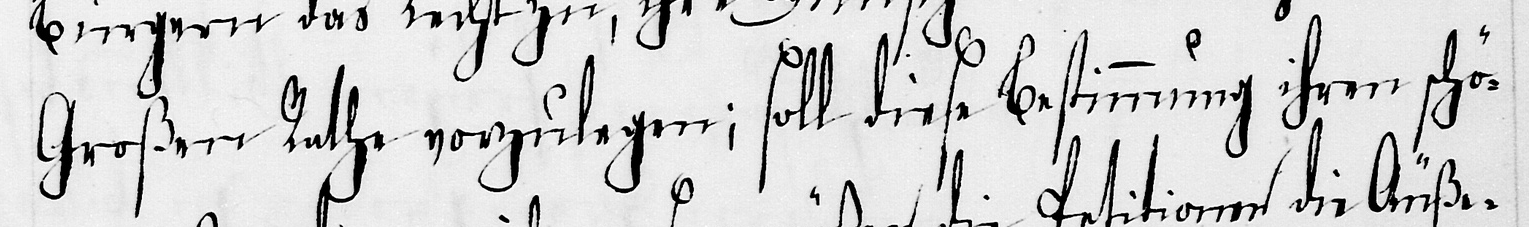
Großen Rathe vorzulegen; soll diese Bestimmung ihren schö¬
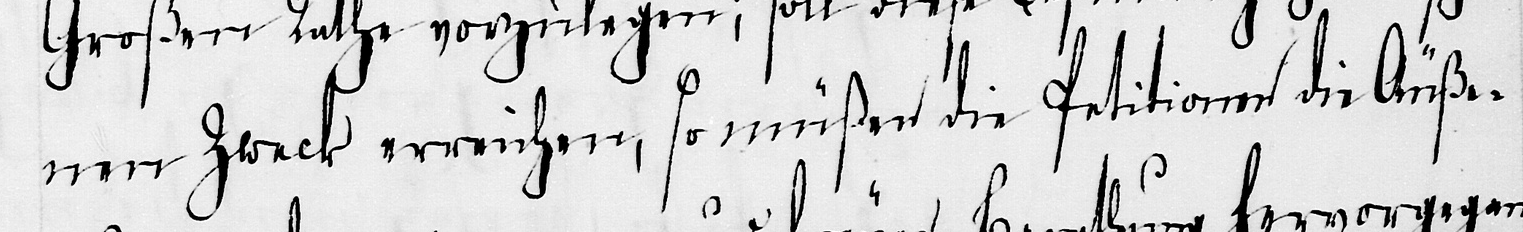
nen Zweck erreichen, so müßen die Petitionen die Äuße¬
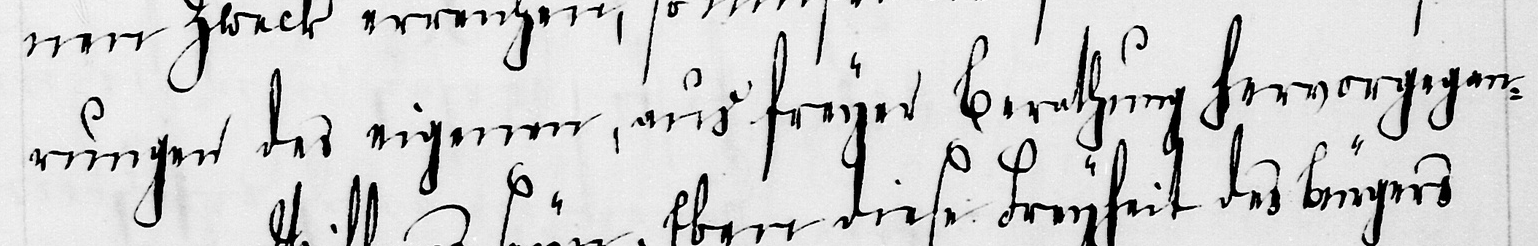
rungen des eigenen, aus freyer Berathung hervorgegan¬
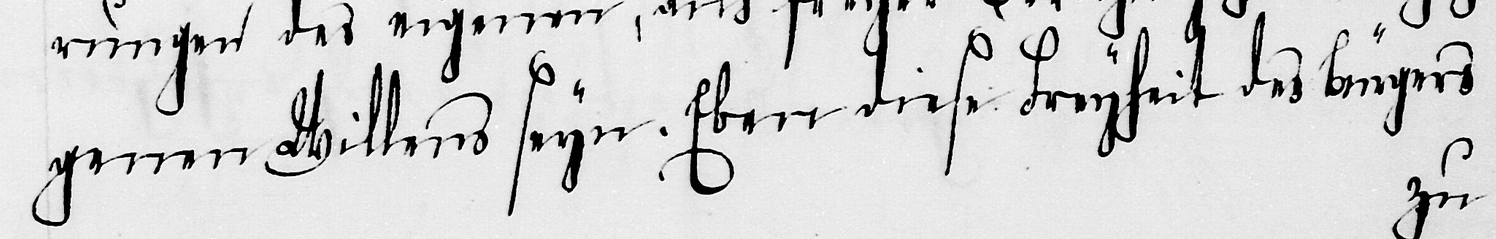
genen Willens seyn. Eben diese Freyheit des Bürgers
